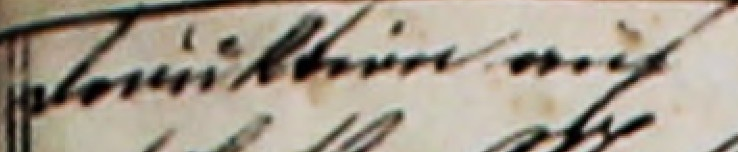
???ktion auf
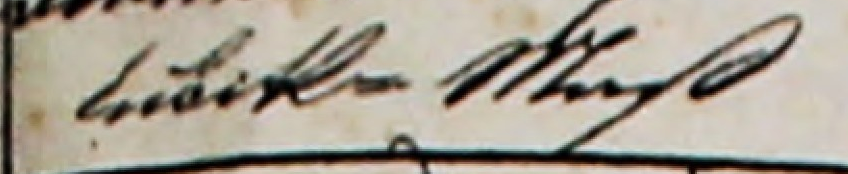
Cubik= Maß
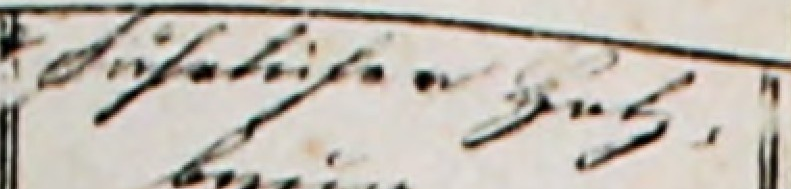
??? Holz„
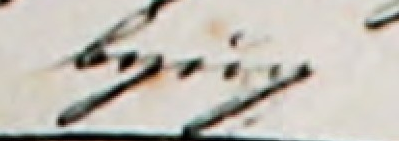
bezug
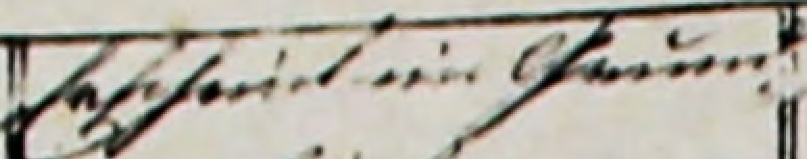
Ersch??? im Grund„
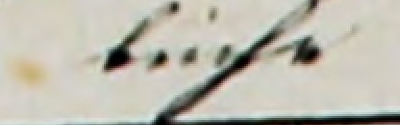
buche
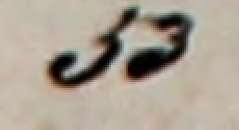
53
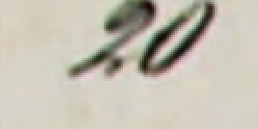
20
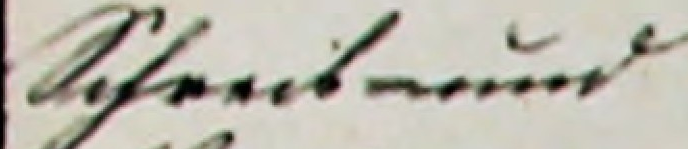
Schreib = und
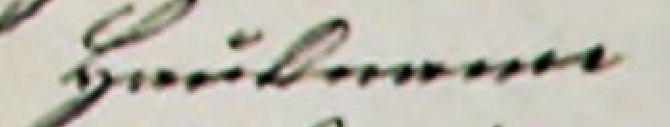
Hausmann
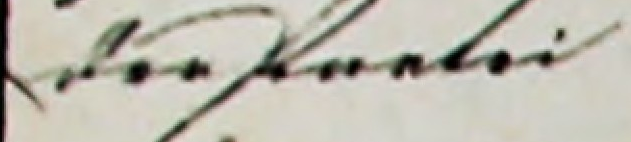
der Partei
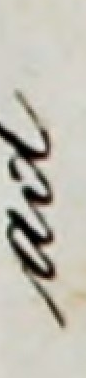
ad
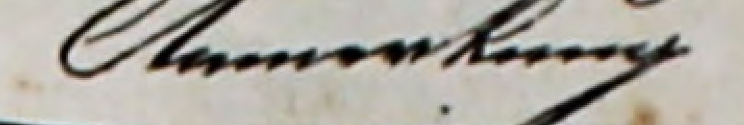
Anmerkung
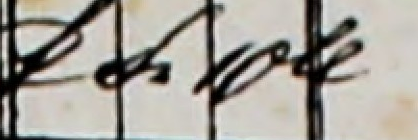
???
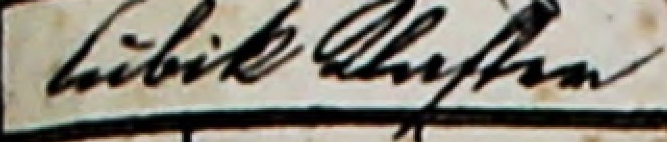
Cubik Klafter
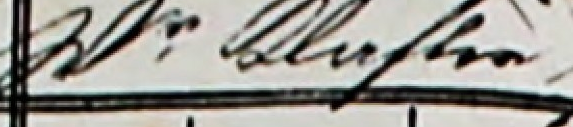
Vr Klafter
